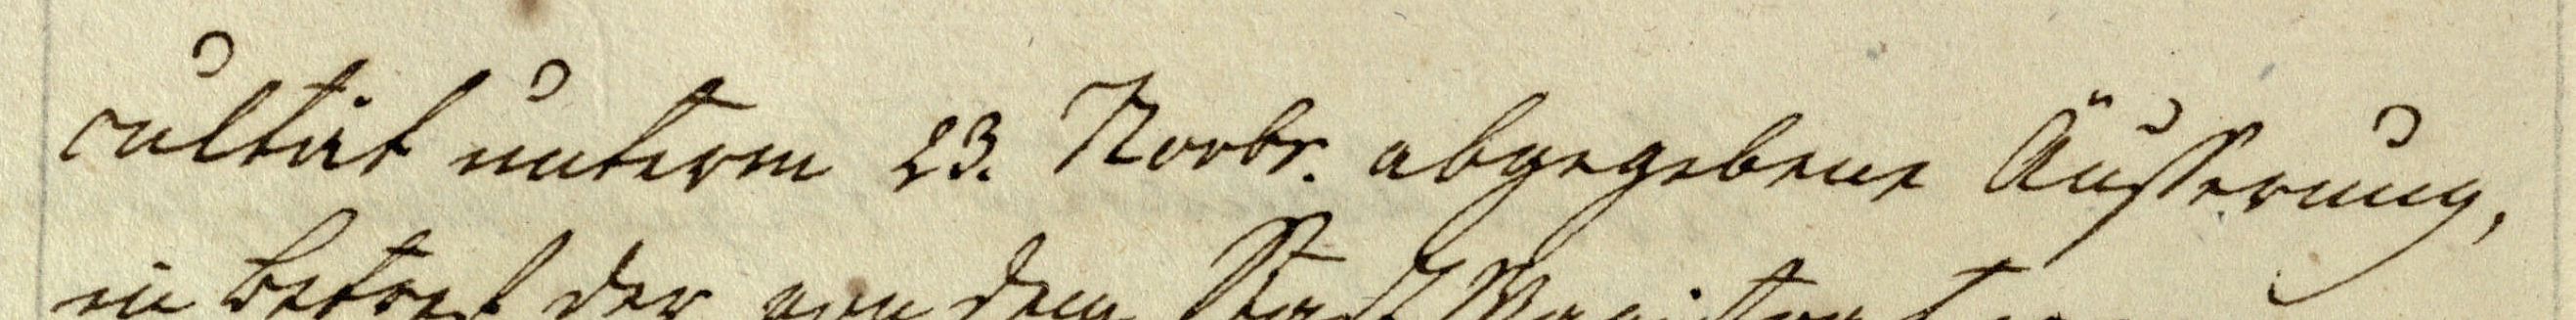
cultät unterm 23. Novbr. abgegebene Äusserung,
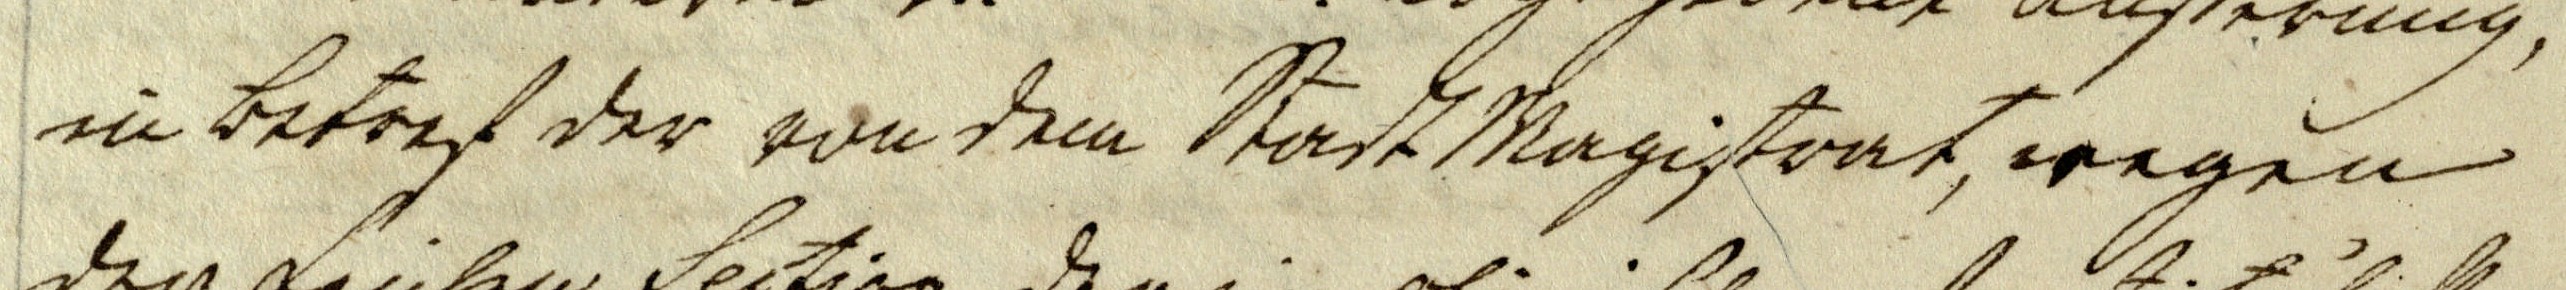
in Betref der von dem Stadt Magistrat, wegen
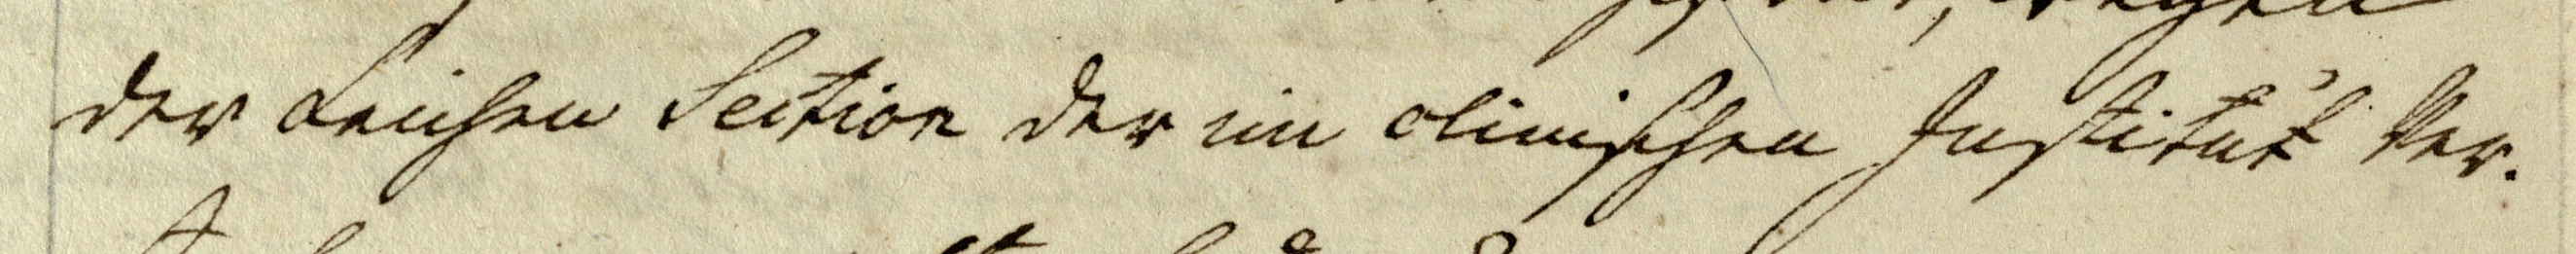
der Leichen Section der im clinischen Institut Ver¬
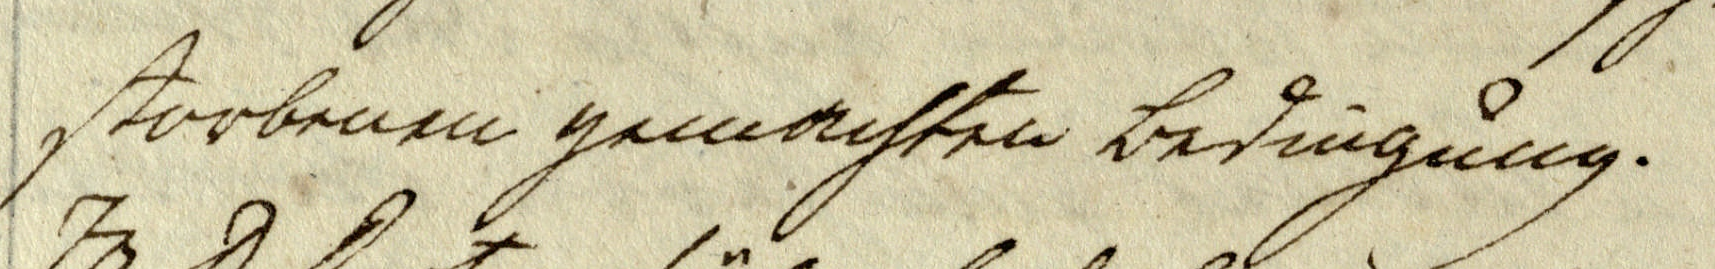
storbenen gemachten Bedingung.
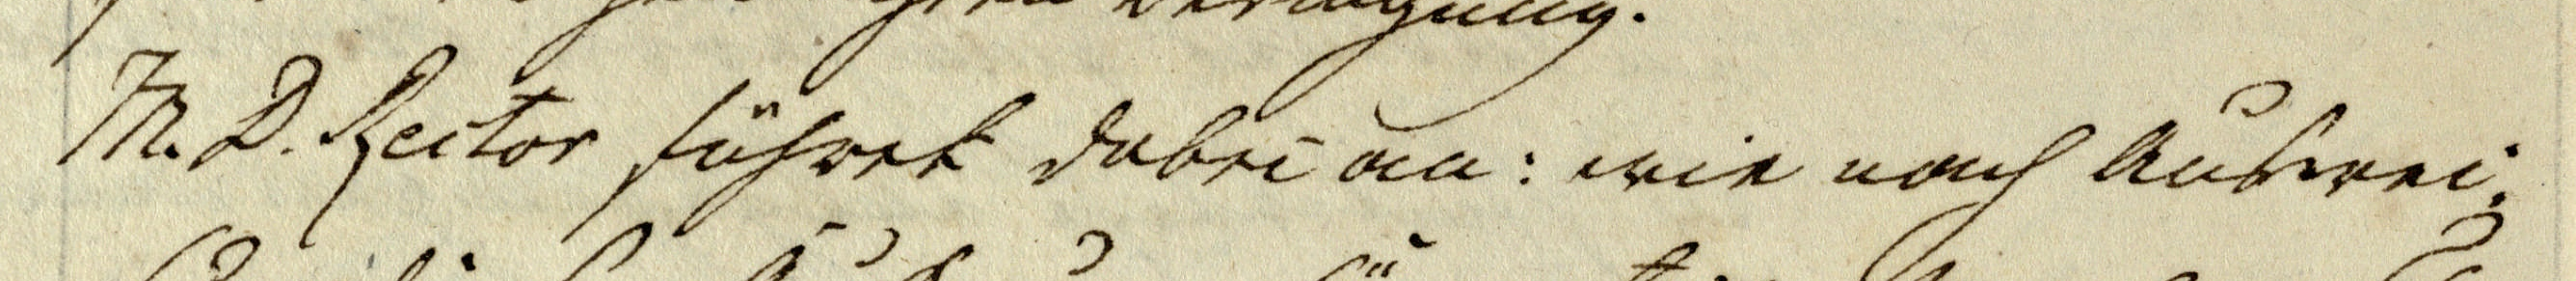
M. D. Rector führet dabei an: wie nach Auswei¬
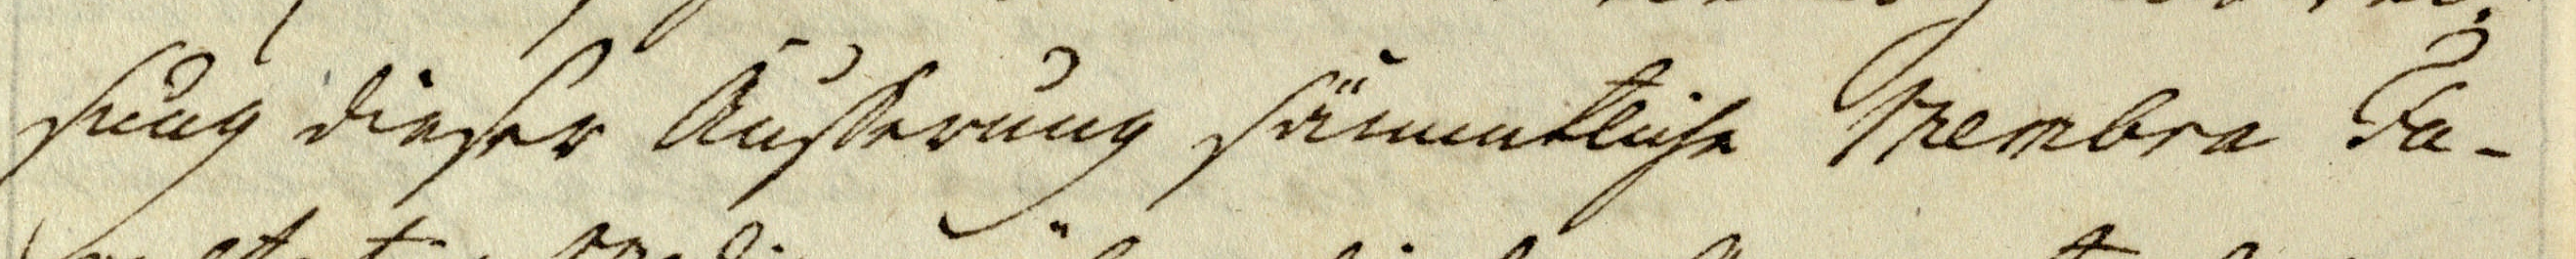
sung dieser Äusserung sämmtliche Membra Fa¬
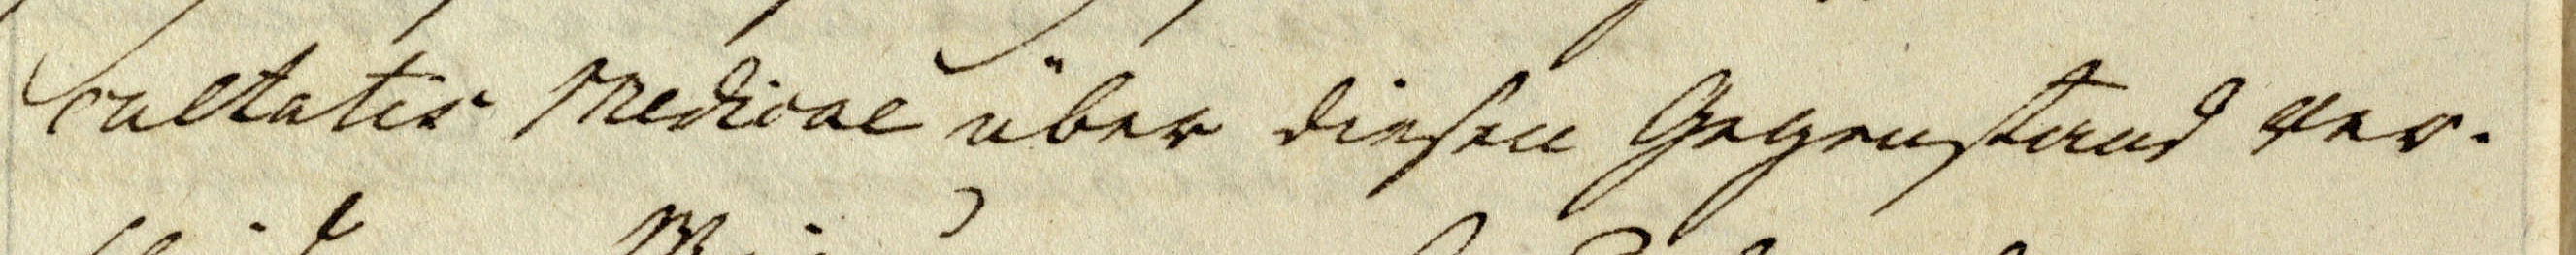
cultatis Medicae über diesen Gegenstand ver¬
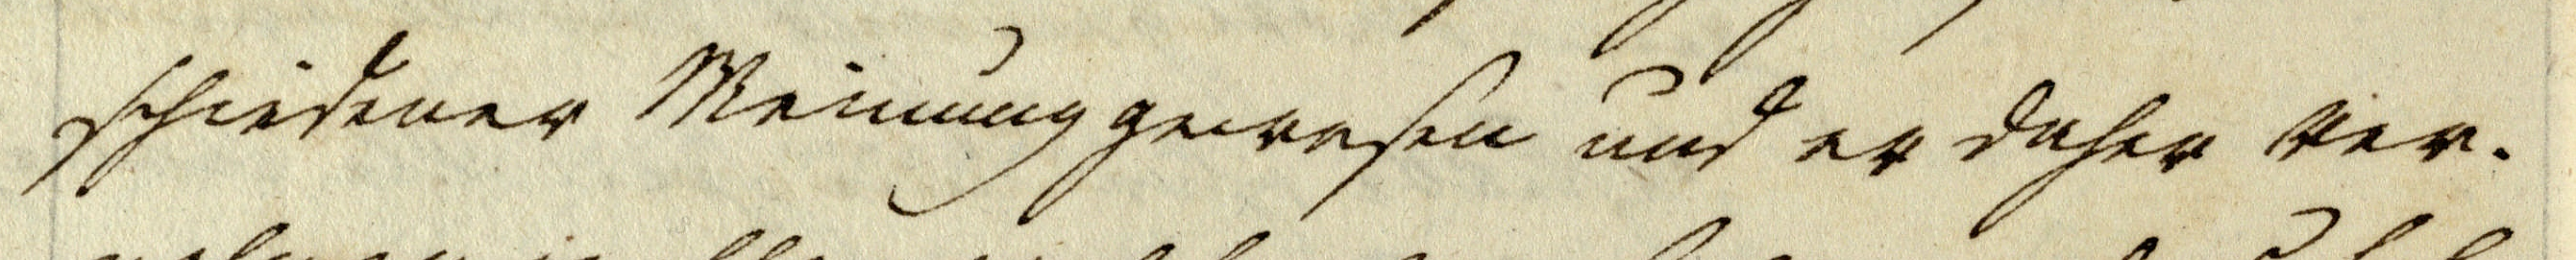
schiedener Meinung gewesen und er daher ver¬
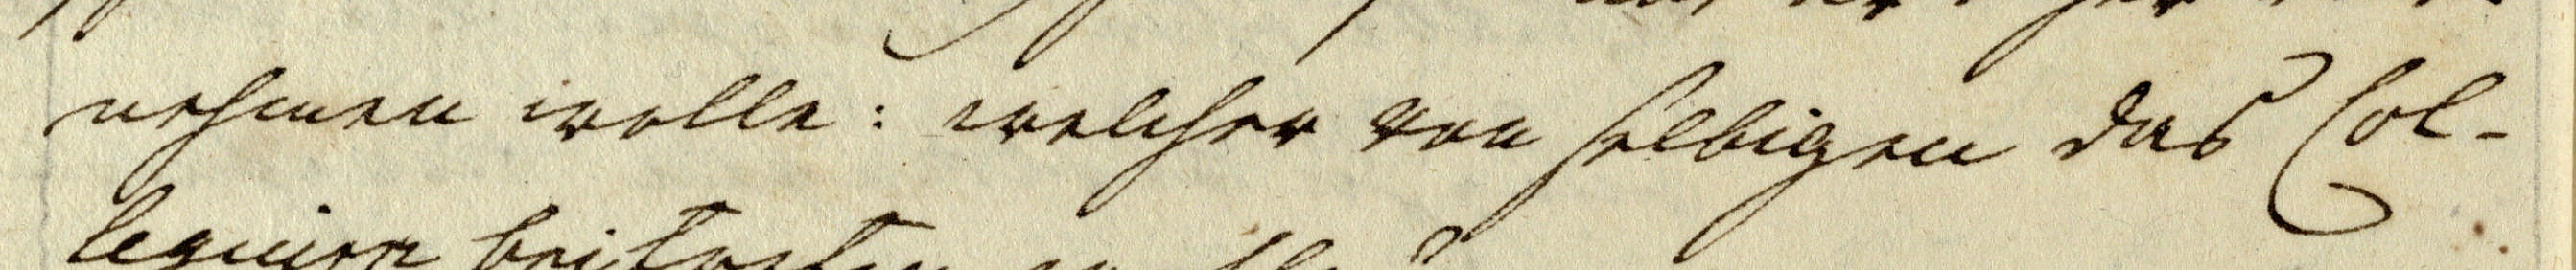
nehmen wolle: welcher von selbigen das Col¬
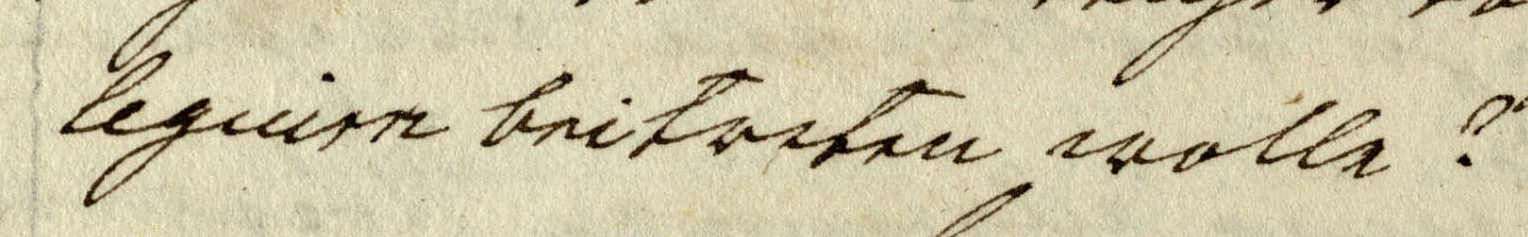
legium beitreten wolle?
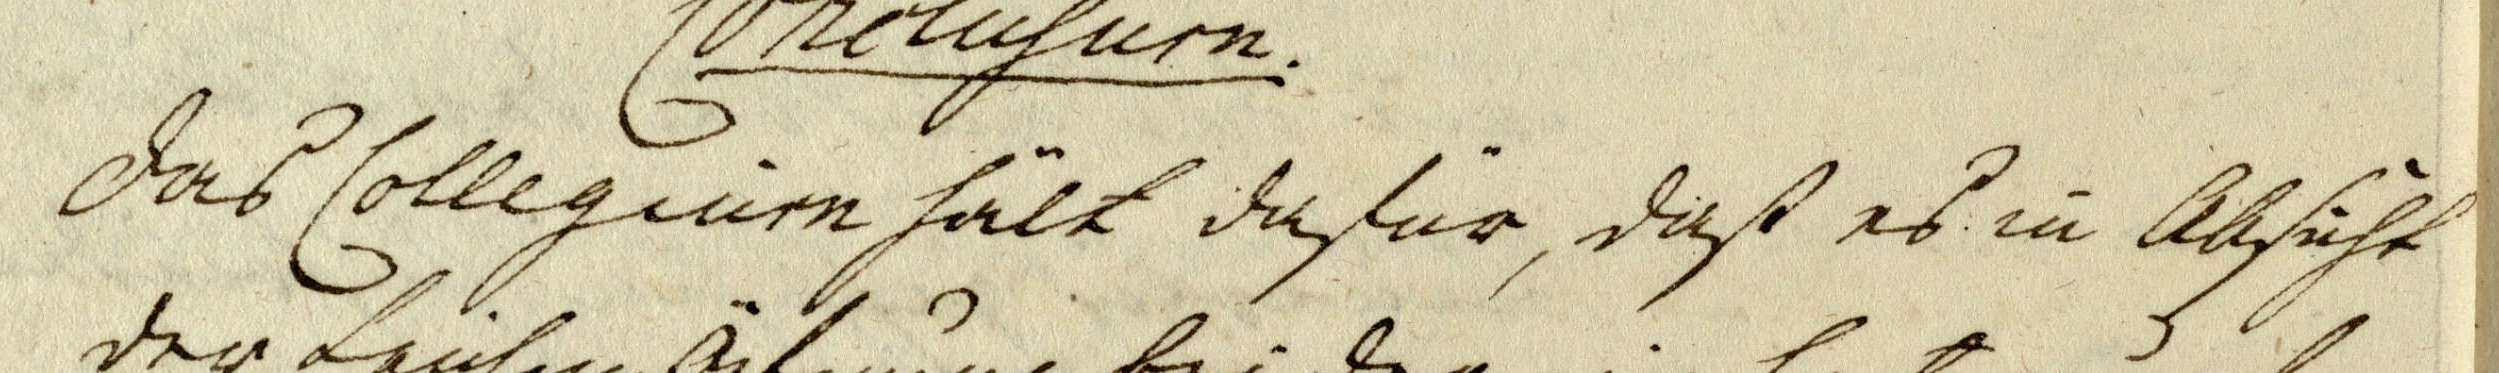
Das Collegium hält dafür, daß es in Absicht
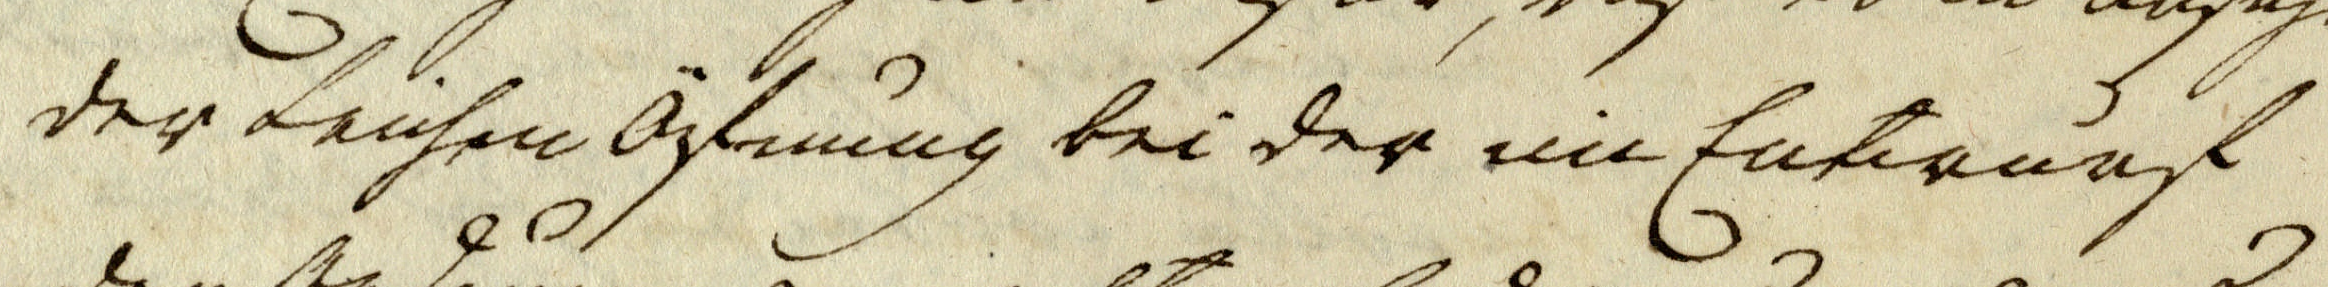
der Leichen Öfnung bei der im Entwurf
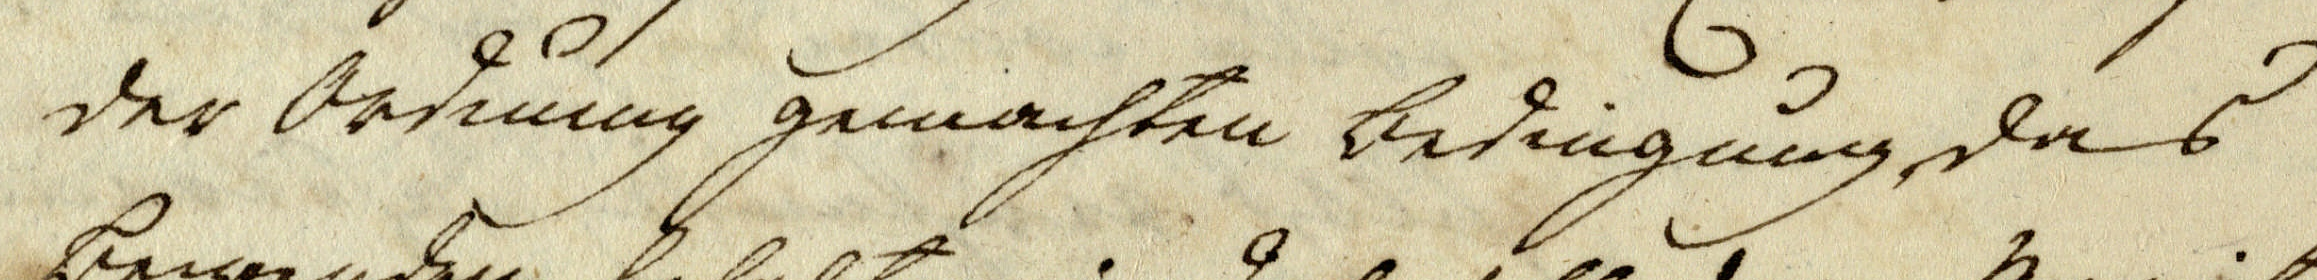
der Ordnung gemachten Bedingung das
